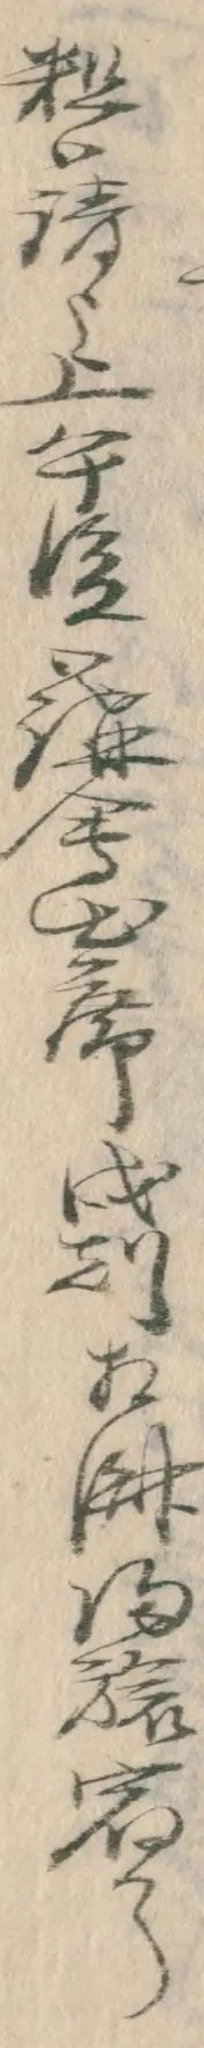粗御請申上午後御講會出席戌刻相済帰旅宿了
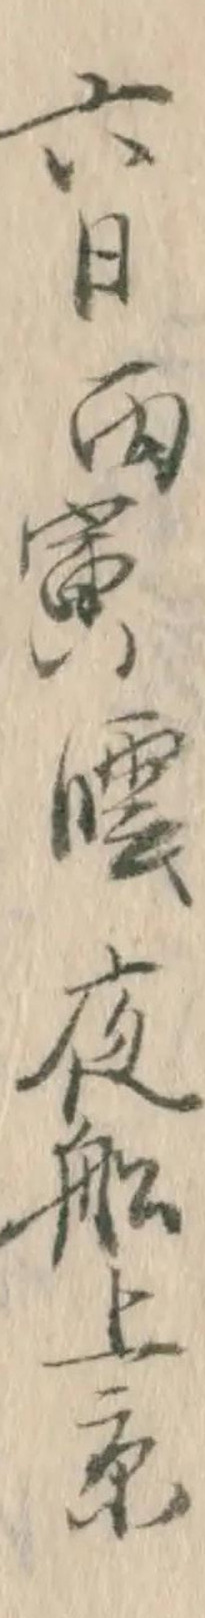六日丙寅曇夜舩上京
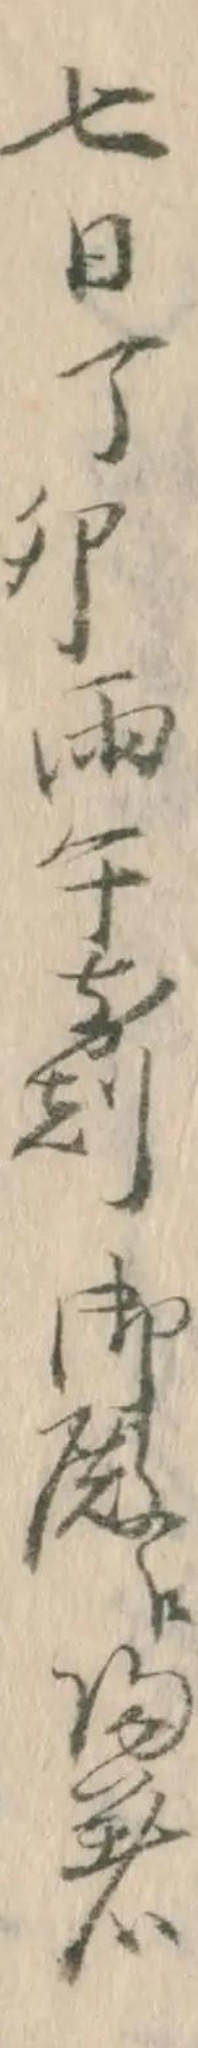七日丁卯雨午前刻御殿え帰着
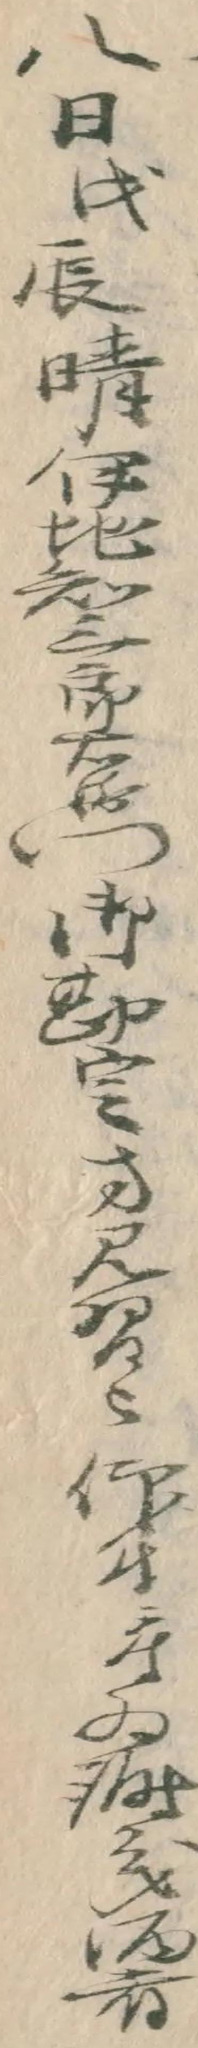八日戊辰晴伊地知三郎右衛門御勘定方見習被仰付ニ付為謝義酒肴

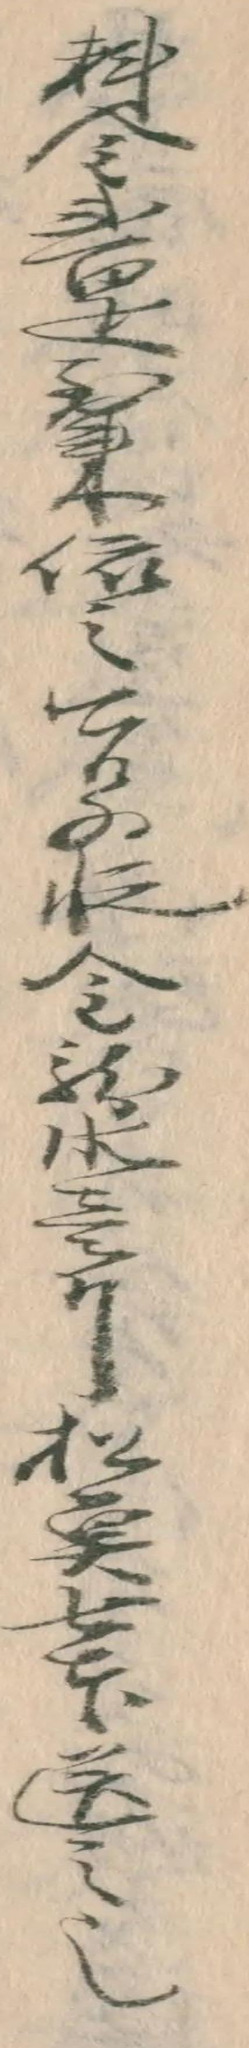料金弐百疋到来依之今日為収金龍水壱丁松魚七本送之也
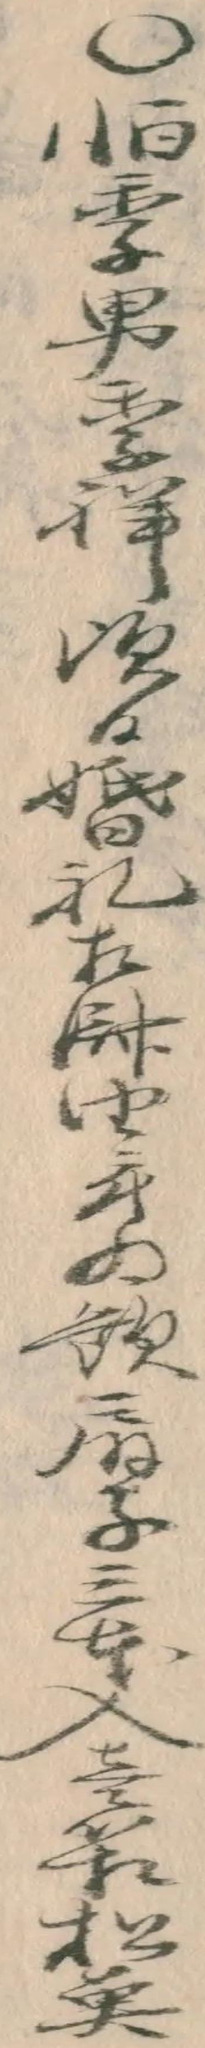◯恒季卑季祥頃日婚礼相済由ニ付為歓扇子三本入壱箱松魚
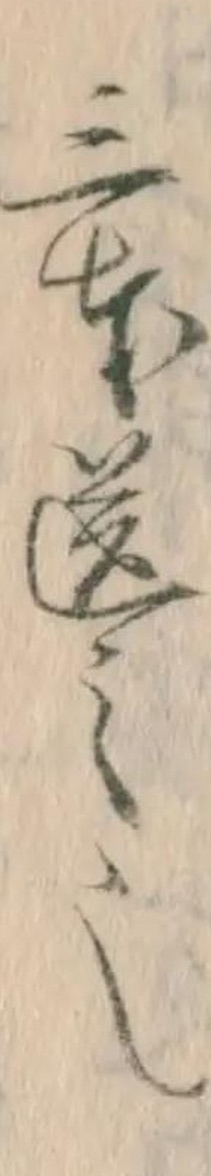三本送之也
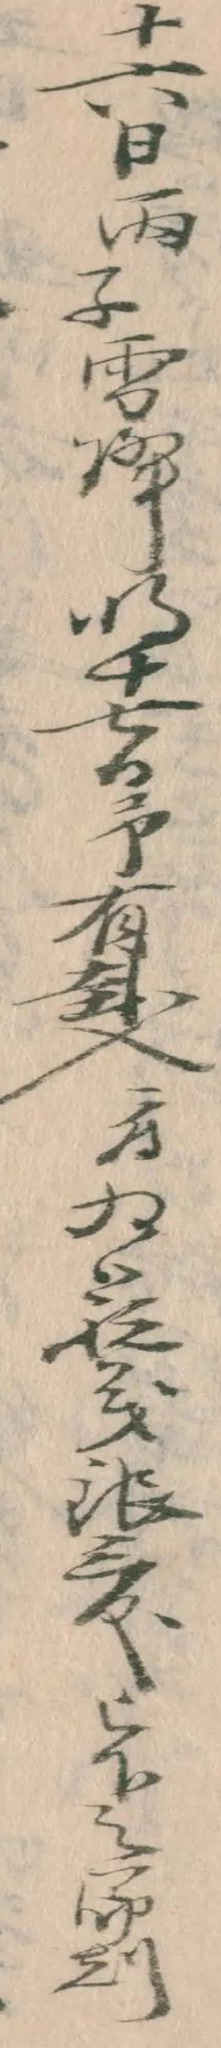十六日丙子雪降明十七日予有赴入ニ付為御祝義銀三匁被下之即刻
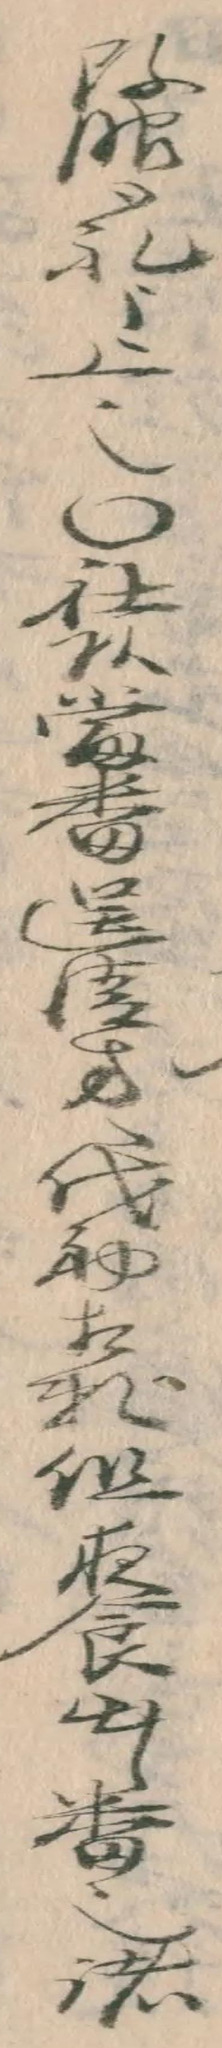改服御礼申上也○社頭當番逞清方へ代勤相頼但夜食出シ番也諸
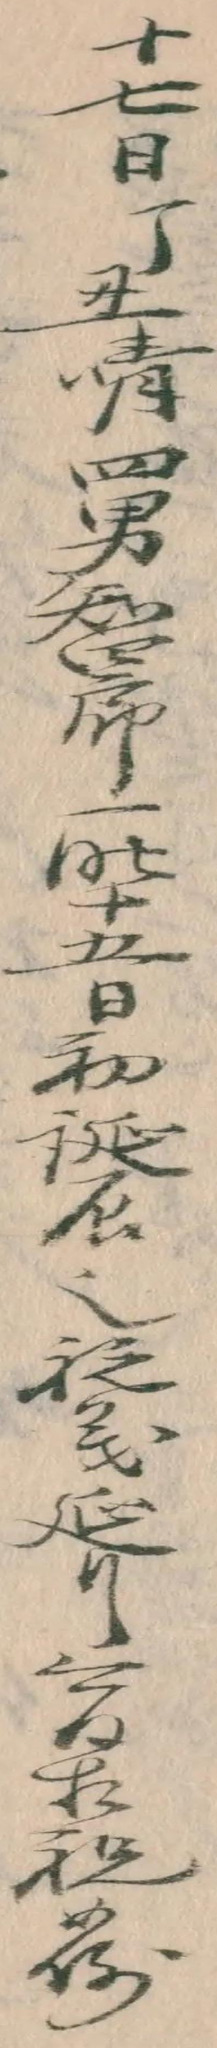十七日丁丑晴四男知四郎一昨十五日初誕名也祝義延引今日相祝如例
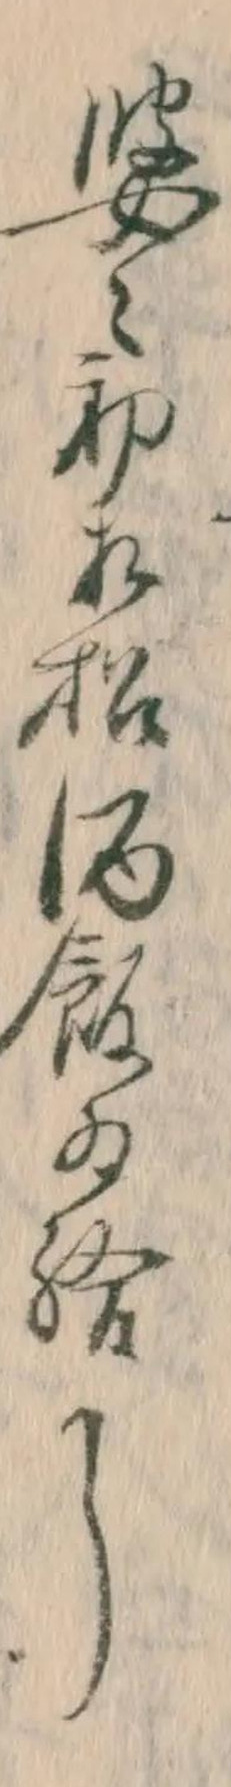婆〻初相招酒飯為給了
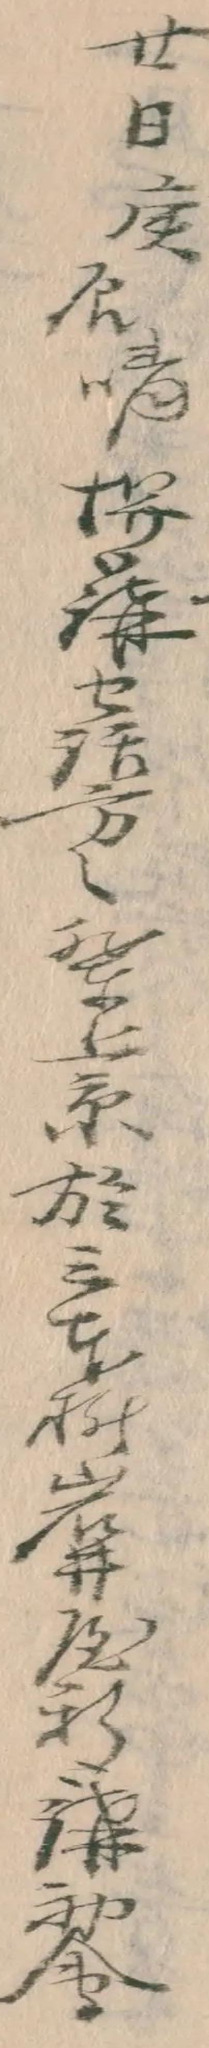廿日庚辰晴堺御講世話方之葉上京於三本樹岩井屋新御講初會
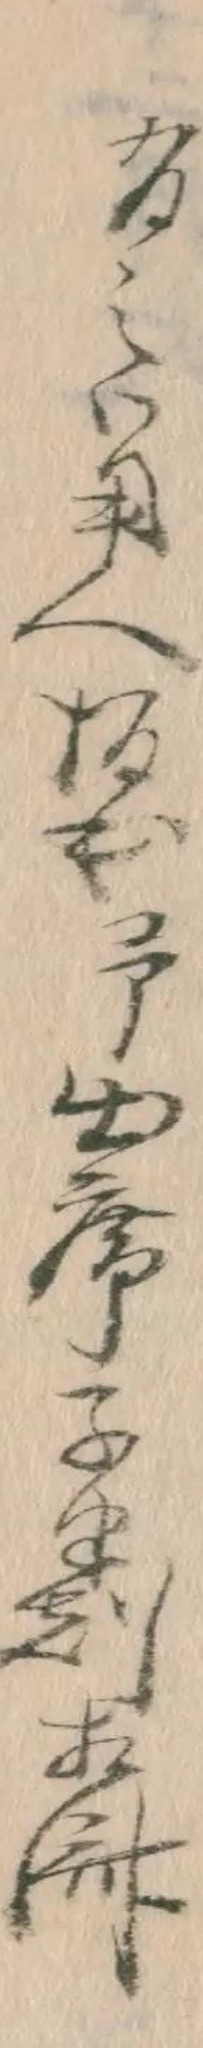有之御用人坂本予出席子半刻相済
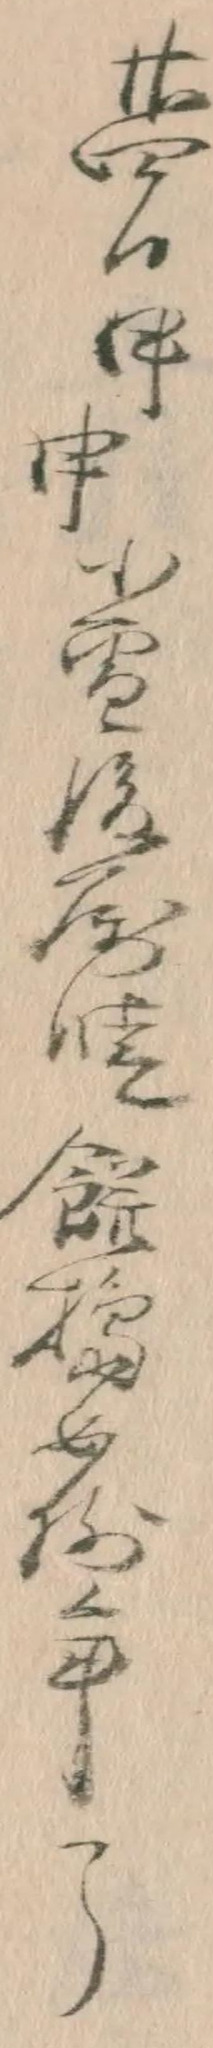廿四日甲申小雪後属晴餅搗如例年了
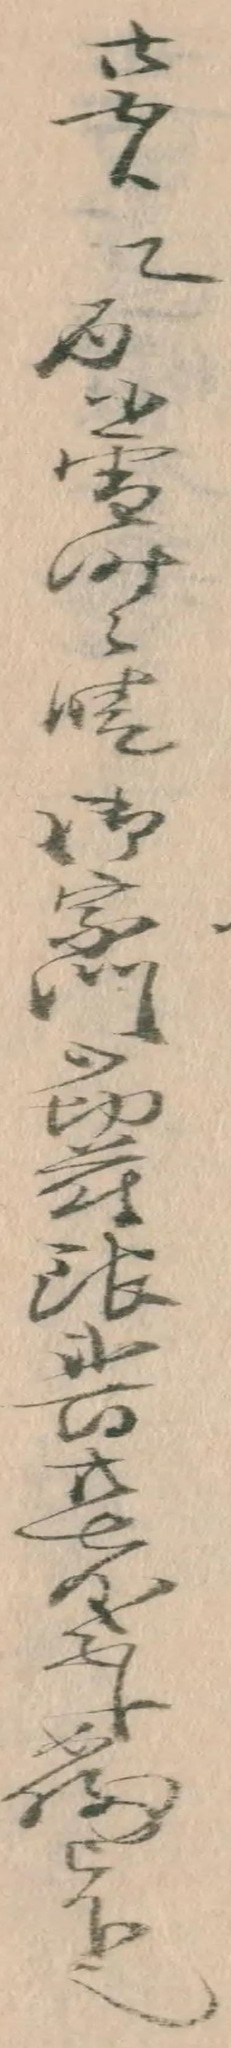廿五日乙酉雪時之晴御家門御切符銀弐百廿七匁壱分御残被下也
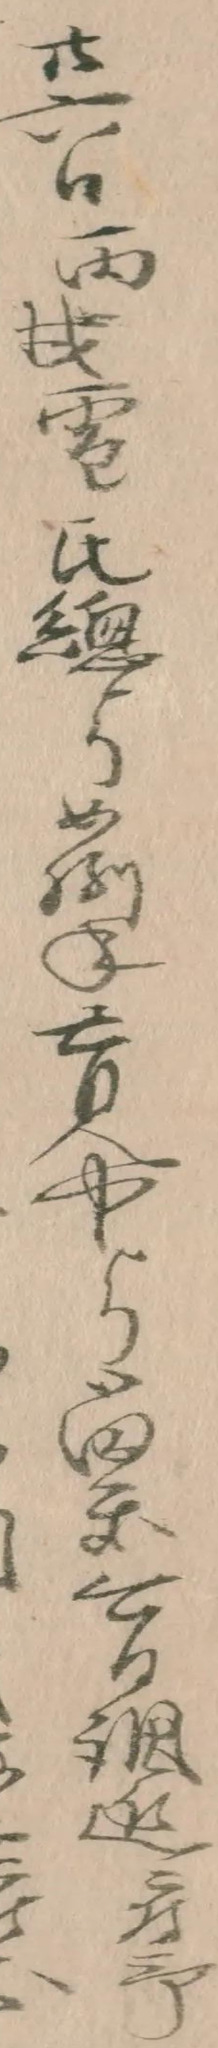廿六日丙戌雪氏總より如例年盲人中より御田楽今日調進ニ付予
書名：賀茂社記録. 第65冊
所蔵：国立国会図書館 National Diet Library, JAPAN
